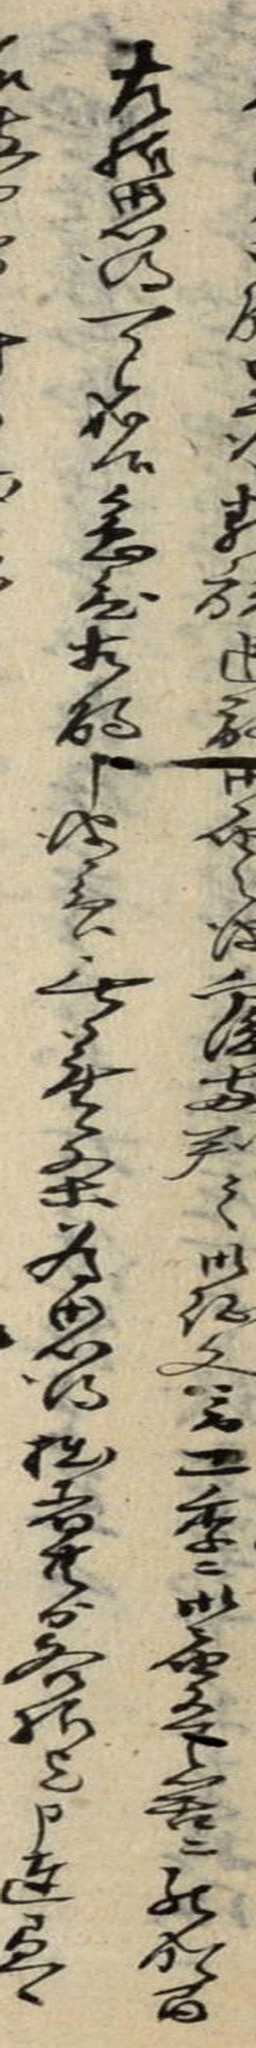左様御心得可被成候急度相触申儀にては無御座候条為御心得拙者共ゟ各様迄申達置候
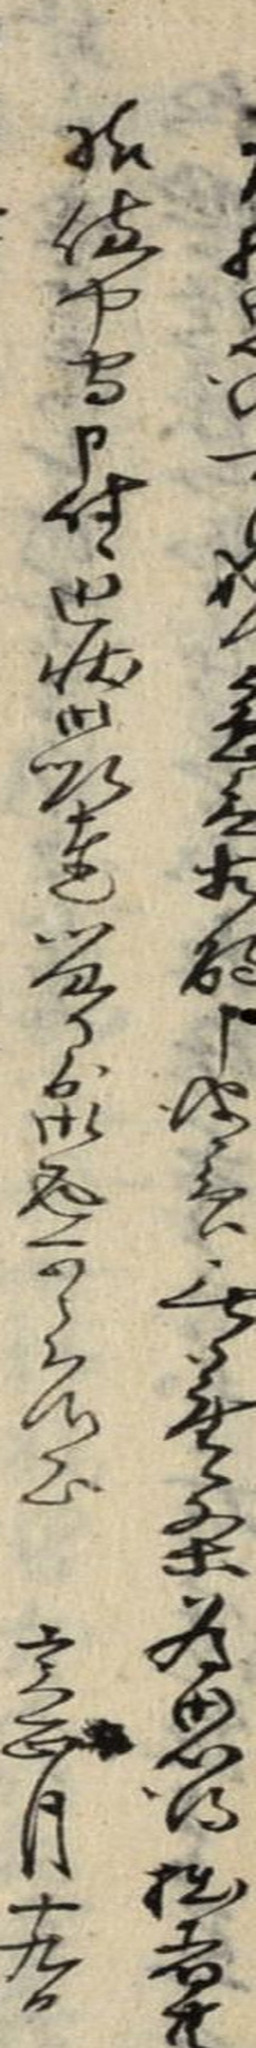様備中守申付候廻状御順達留りゟ御返可被下候以上亥正月十九日
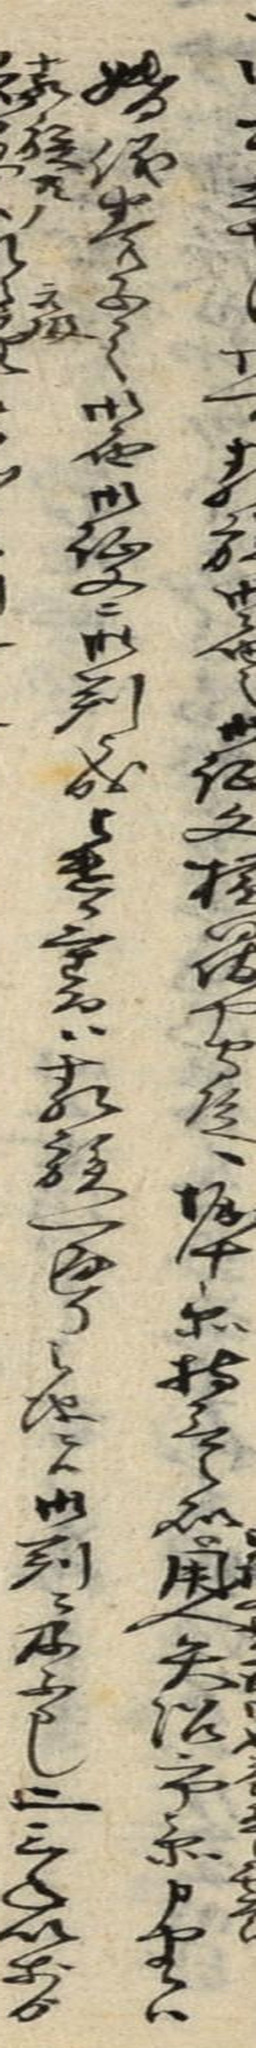婚儀養子之御届御証文に御判被成被遣候重ては類族一通り之儀には御判に及不申候二三年以前ゟ
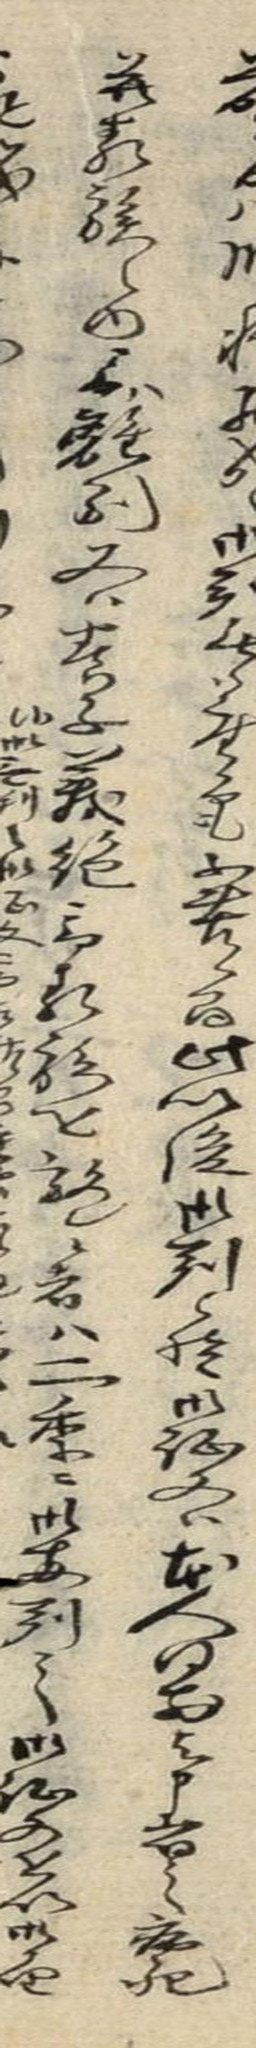并類族之内にては離別又は養子義絶にて類族を放レ候者は二季に御両判之御証文を以御届
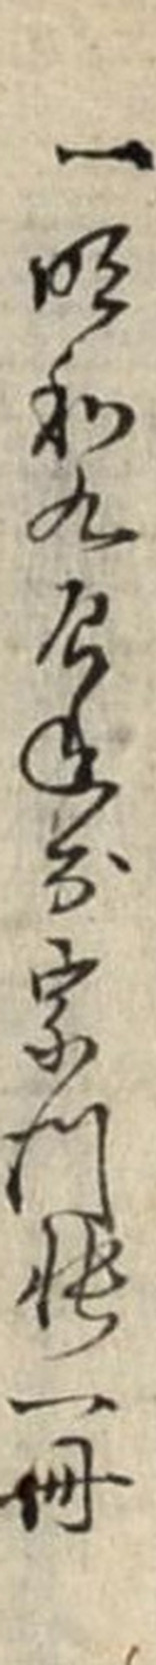一明和九辰年分宗門帳一冊
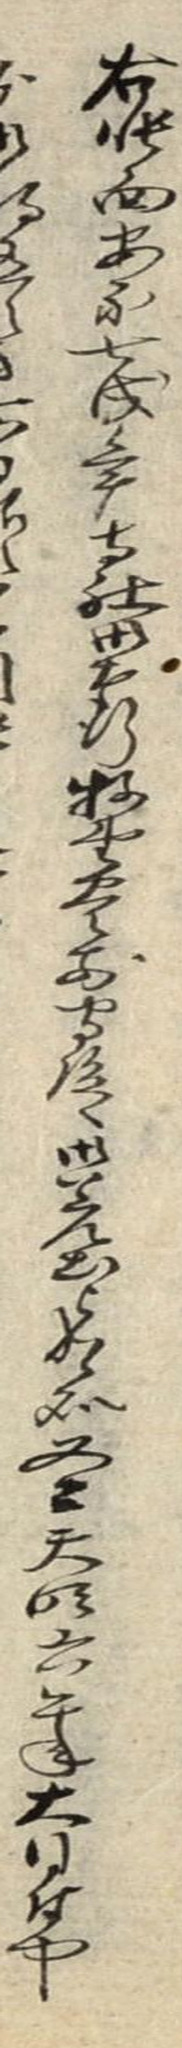右帳面安永七戌年寺社御奉行牧野豊前守殿へ御差出被成候処又々天明六午年大目付中
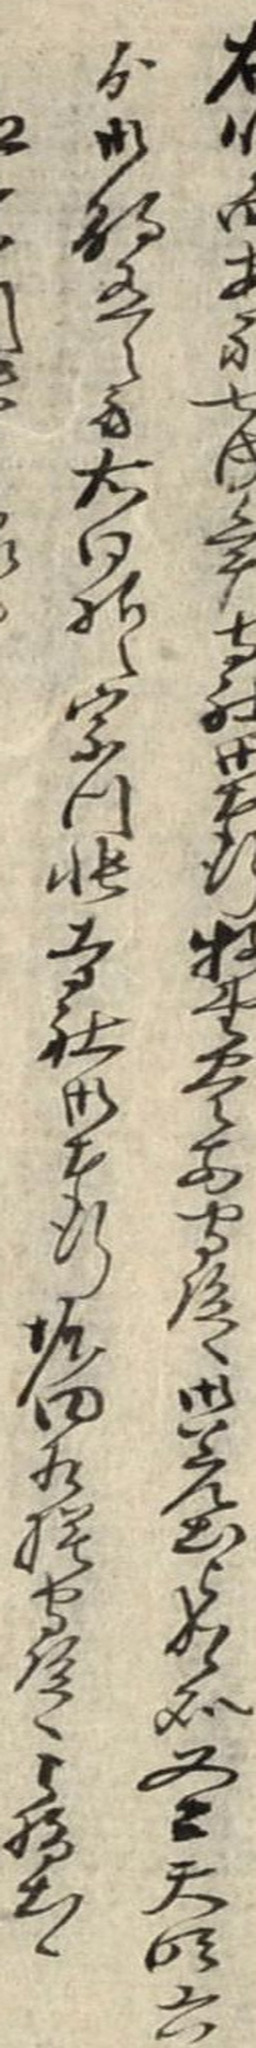ゟ御触有之に付右同様之宗門帳寺社御奉行堀田相模守殿へ被指出候
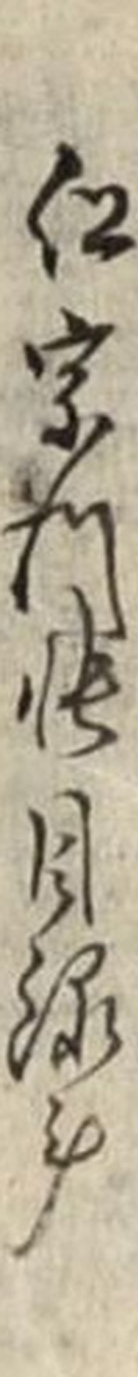但宗門帳目録斗
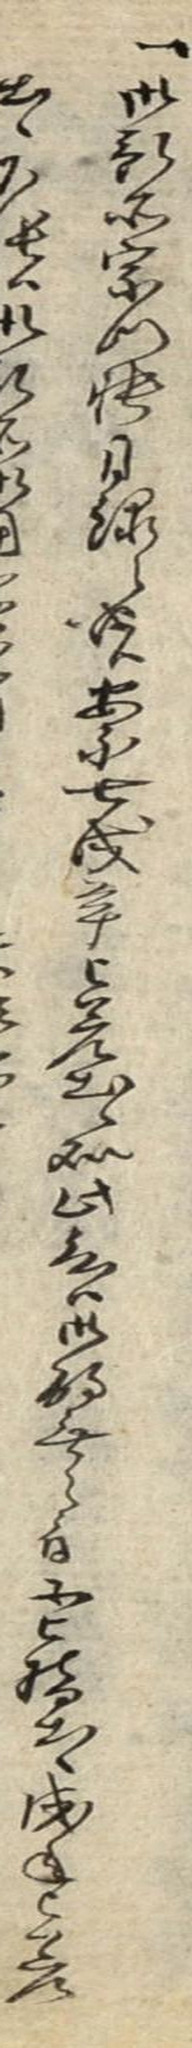一御預所宗門帳目録之儀は安永七戌年被差出候処此度は御触無之に付不被指出候戌年被差
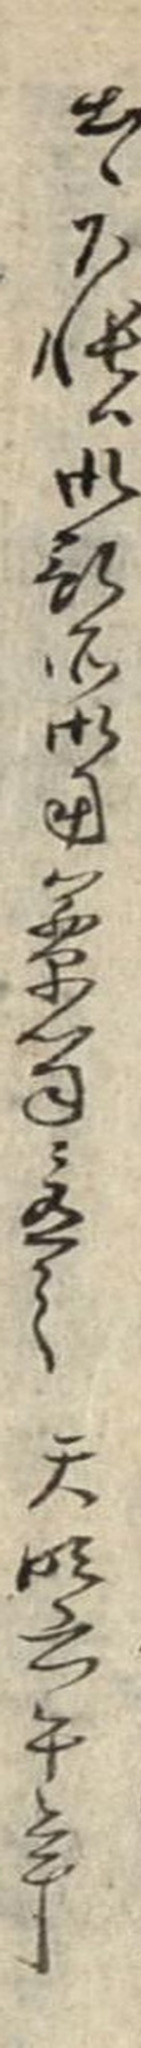出候下帳は御預所御用箪笥に有之天明六午年
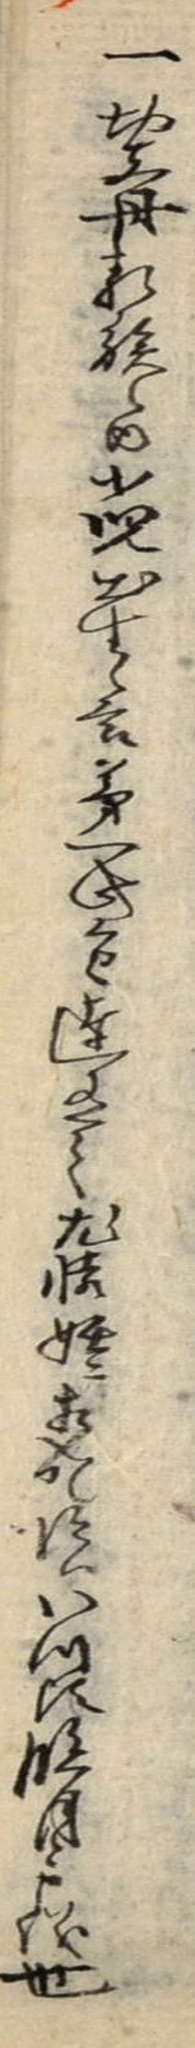一切支丹類族之内小児出生之節第一此方へ達有之尤懐妊に相成候得はいつ頃臨月と申儀世

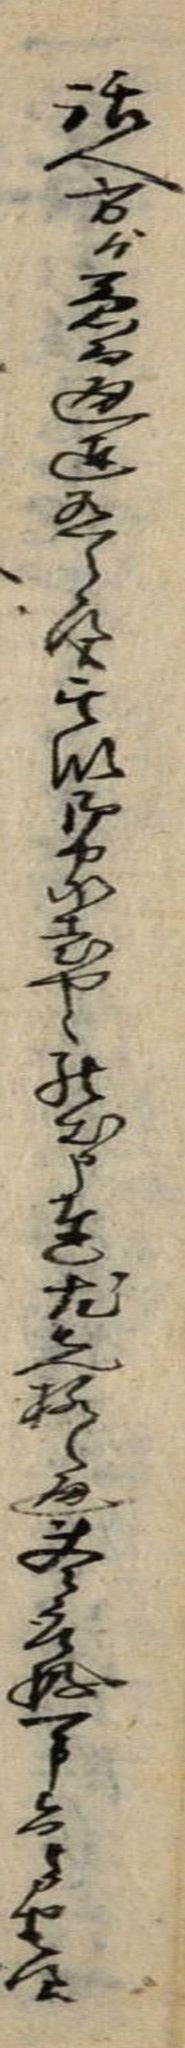話人方ゟ兼て通達有之候得は其段御家老中へ罷出申達尤先格之通夫々取扱可申旨被申聞候儀は
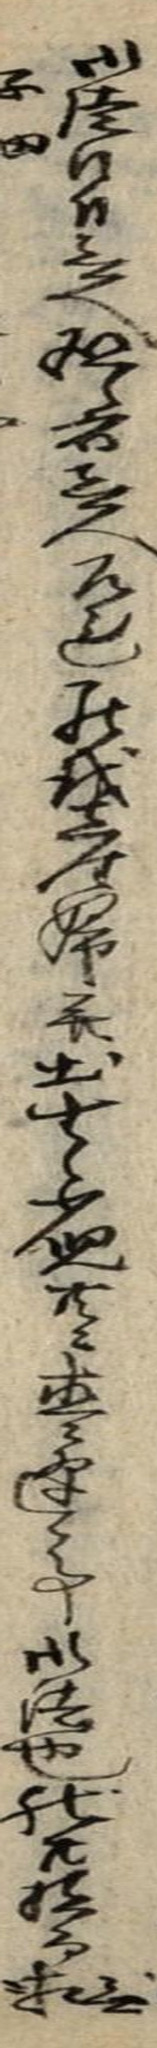御徒目付壱人組之者壱人召連罷越産婦并出生之小児共に直に逢候事御法也然共指て相無
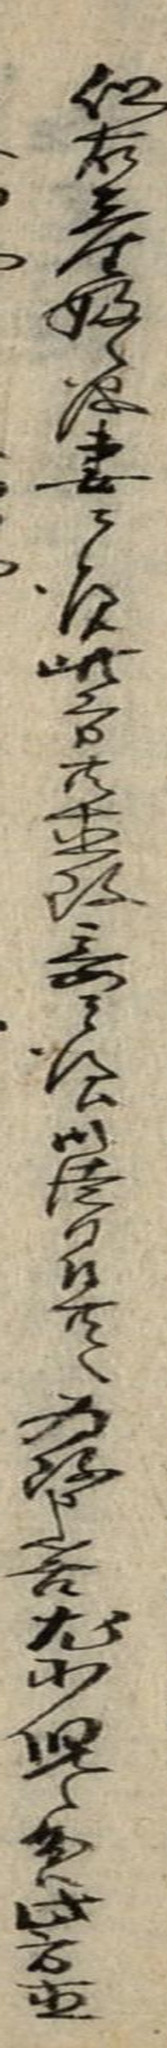但右産婦之儀妻に候得は此方共直改妾に候得は御徒目付共へ為改申筈尤小児之分は此方直
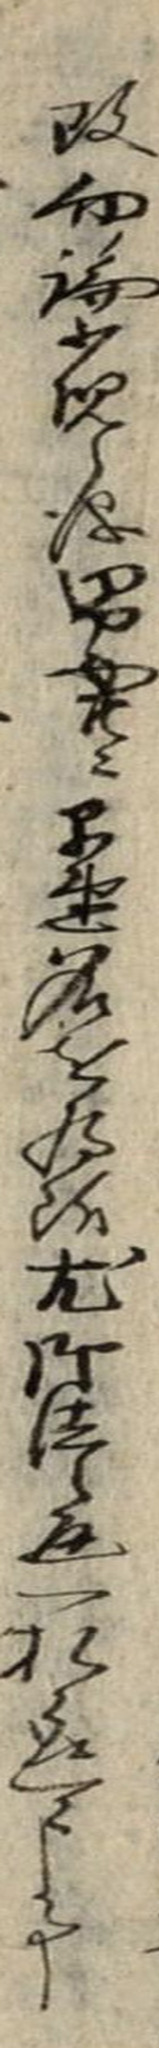改勿論小児之儀男女共に早速名を為附尤御法之通一札取可申事
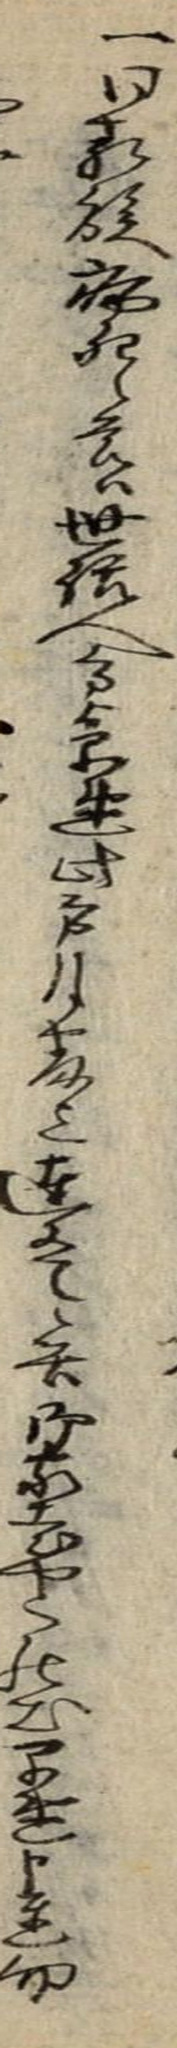一同類族病死之節は世話人方ゟ早速此方月番迄達有之候筈御家老中へ罷出早速申達勿
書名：御停止異変死失
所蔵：福井県文書館 Fukui Prefectural Archives
